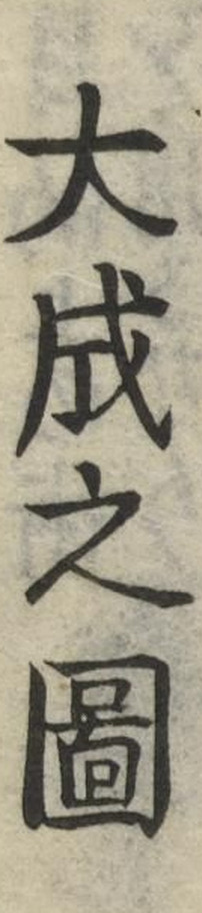大成之図
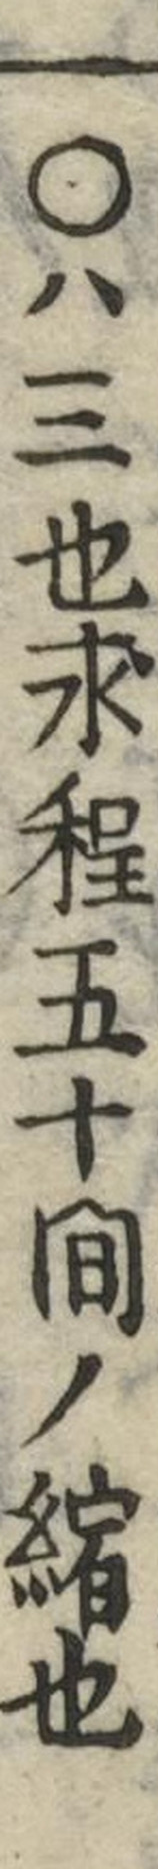○は三也求程五十間の縮也
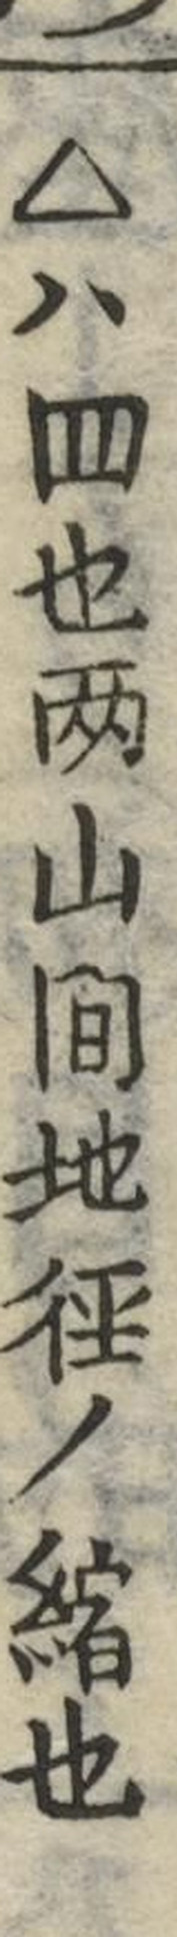△は四也両山間地径の縮也
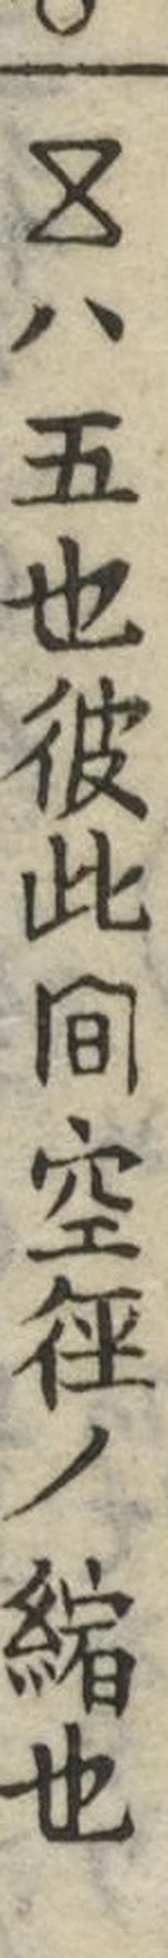▽△は五也彼此間空径の縮也
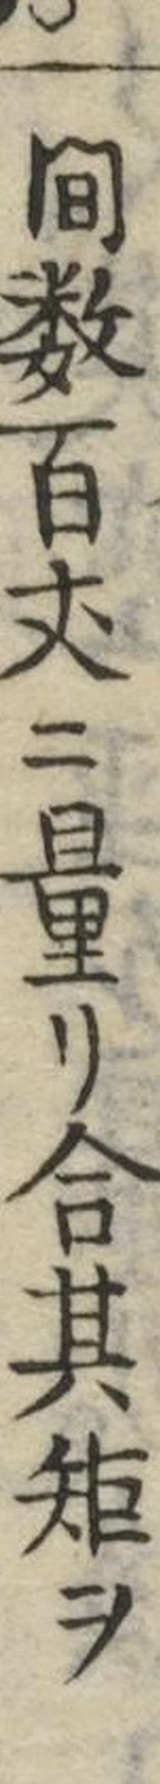間数百丈に量り合其矩を
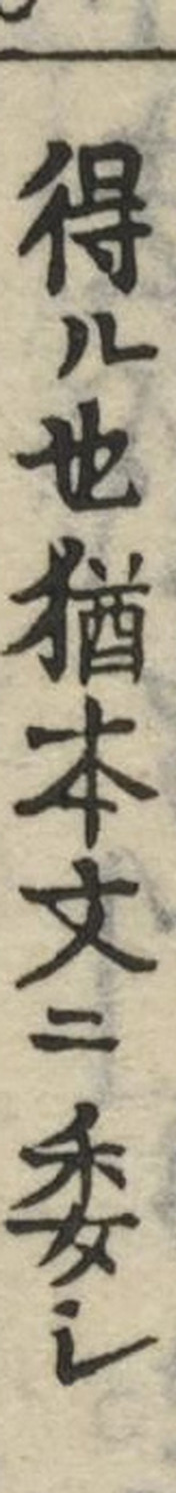得る也猶本文に委し
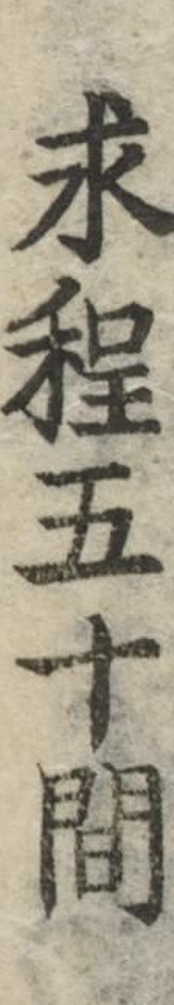求程五十間

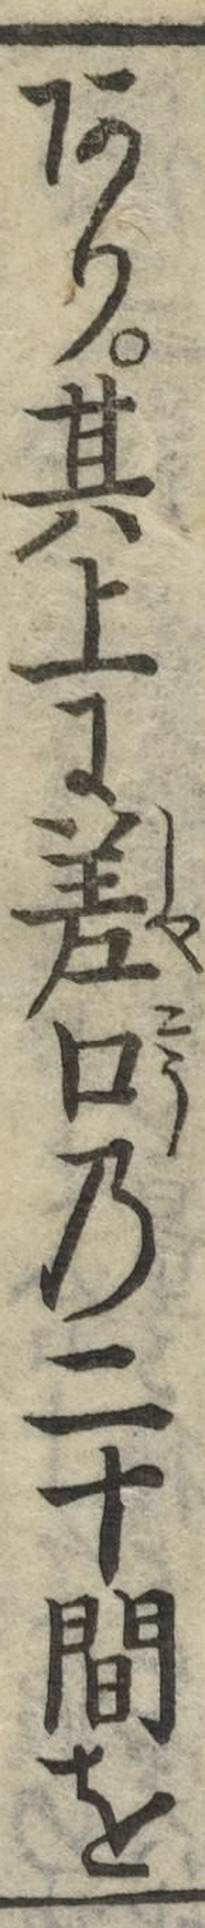あり。其上に差口の二十間を
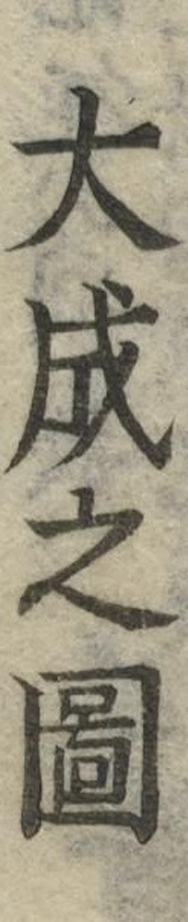大成之図
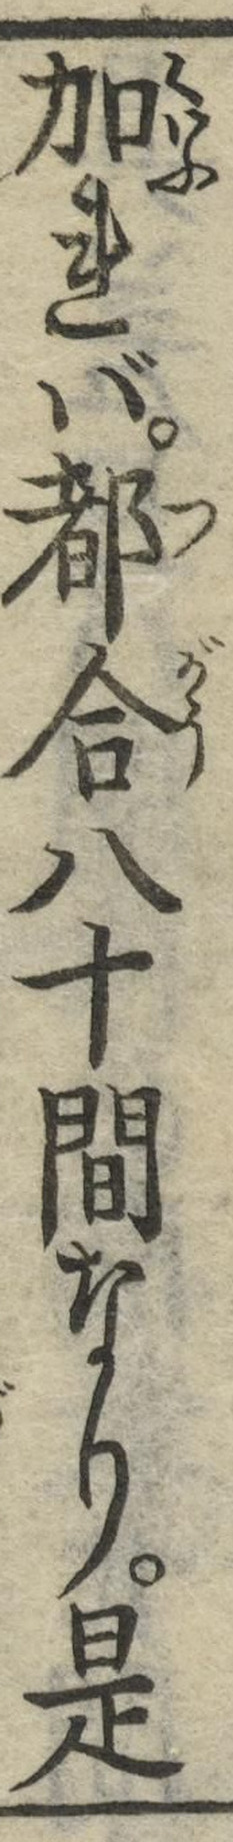加れば。都合八十間なり。是
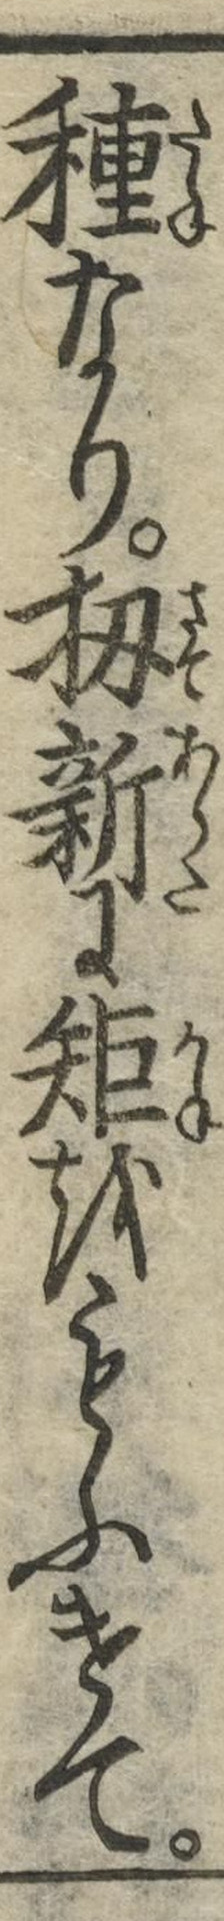種なり。扨新に矩をもふけて。
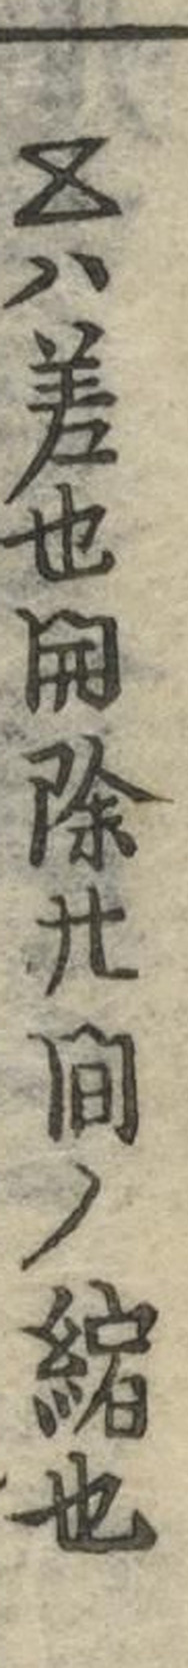▽△ハ差也開余廿間ノ縮也
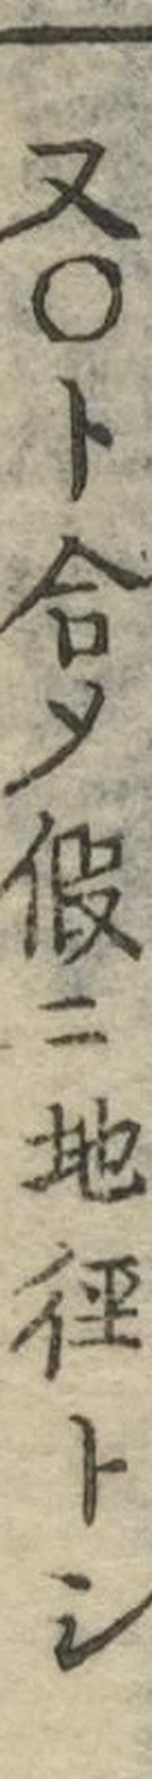又〇ト合シテ仮ニ地径トシ
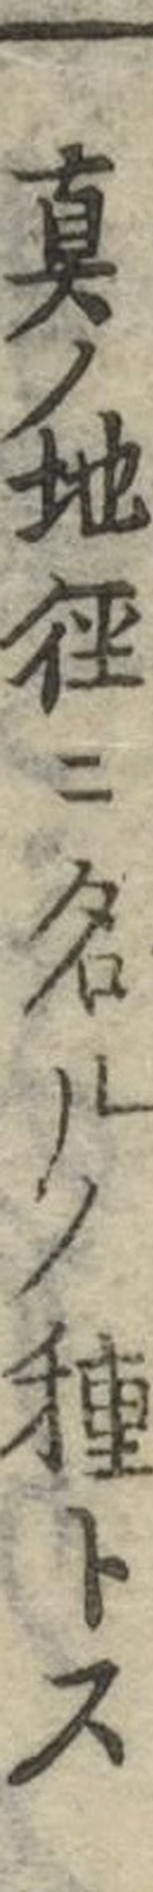真ノ地径ニ名ルノ種トス
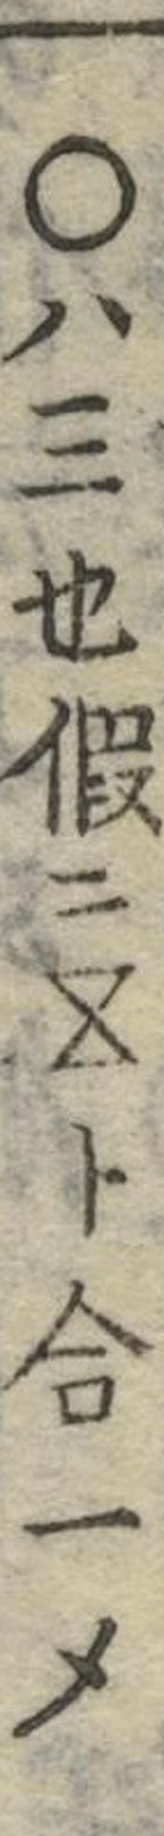〇ハ三也仮ニ▽△ト合一メ
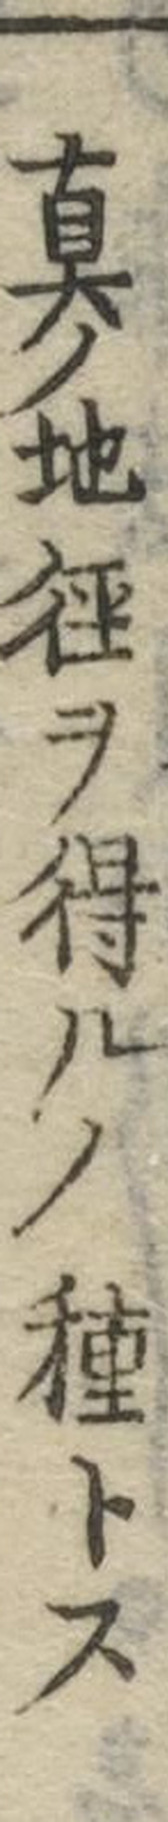真ノ地径ヲ得ルノ種トス
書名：量地指南　巻之三（内題）
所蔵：東京大学地震研究所図書室 Earthquake Research Institute Library, The University of Tokyo, JAPAN
